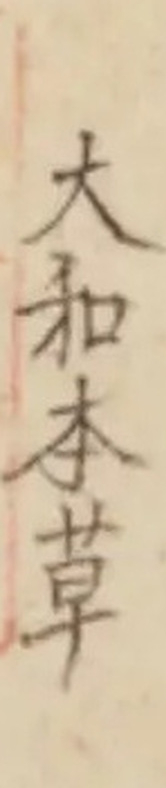大和本草
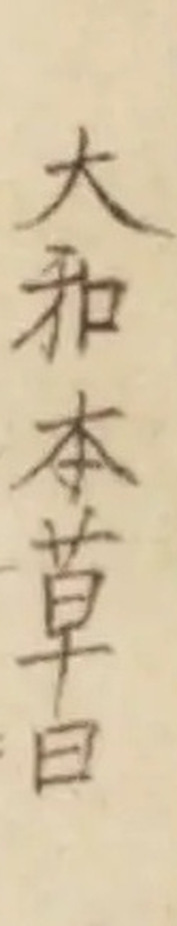大和本草曰
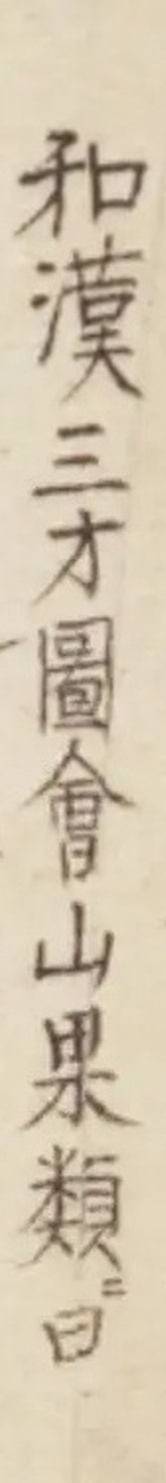和漢三才圖會山果類ニ曰
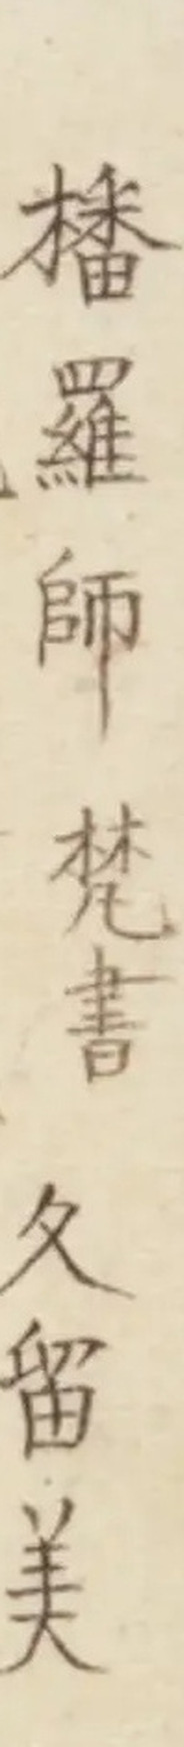胡桃橎羅師梵書久留美
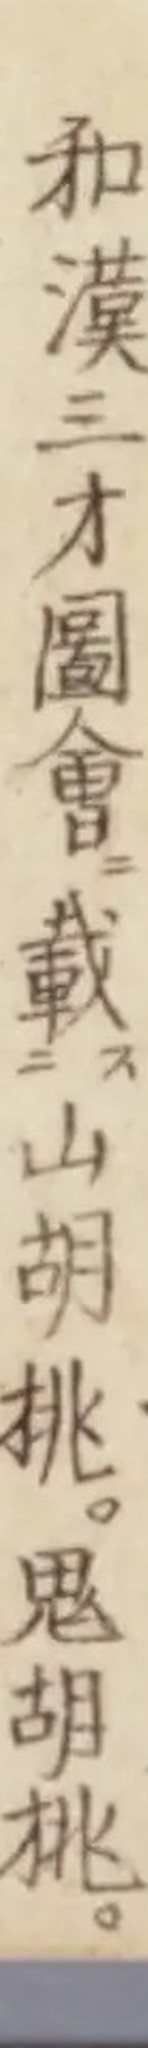和漢三才圖會に載す山胡桃鬼胡桃
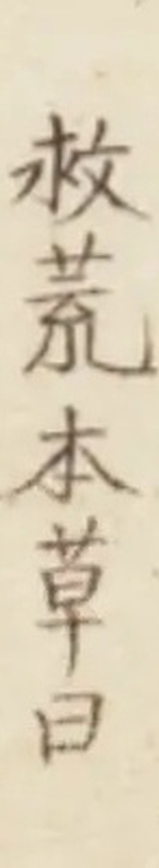救荒本草曰
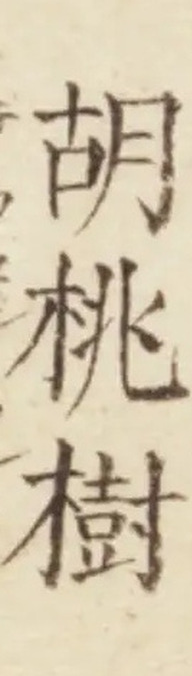胡桃樹
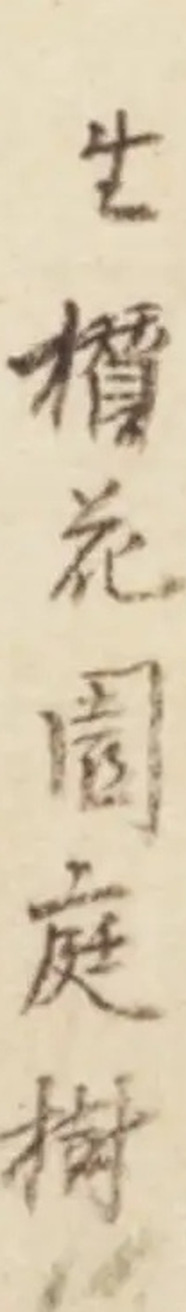生櫕花園庭樹
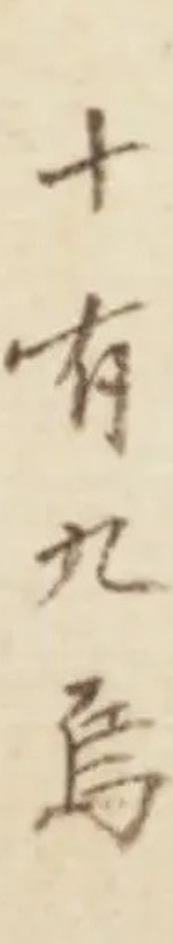十有九日

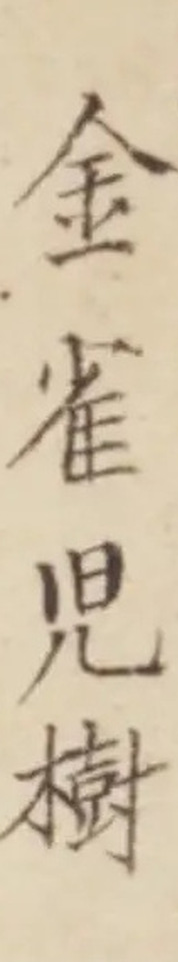金雀児樹
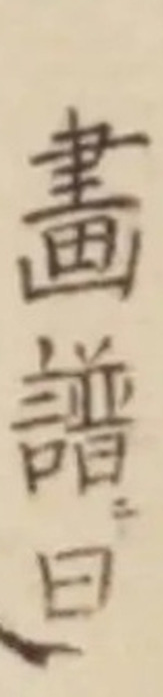畫譜ニ曰
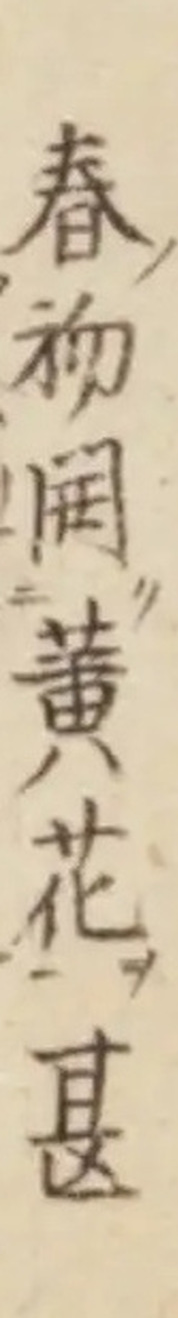春ノ物開ク黄花ヲ甚
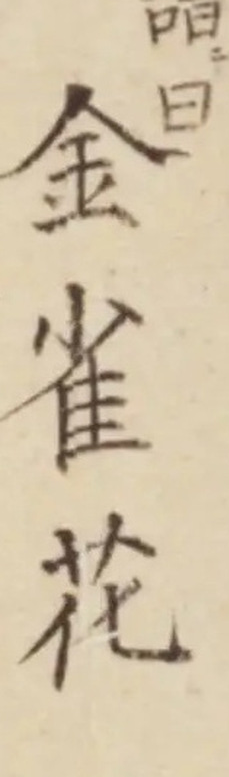金雀花
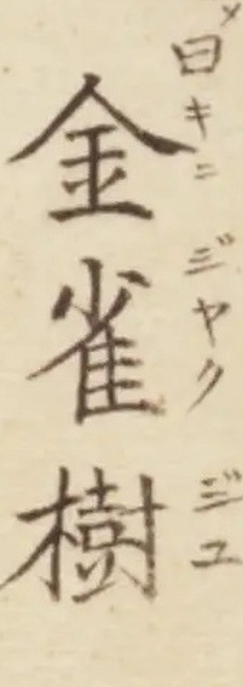金雀樹
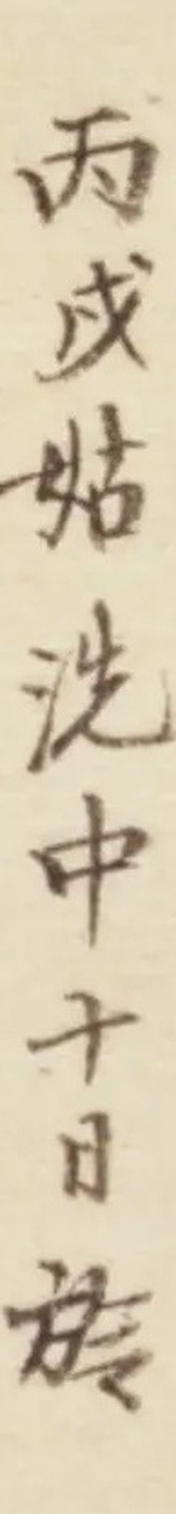丙戌姑洗中十日於
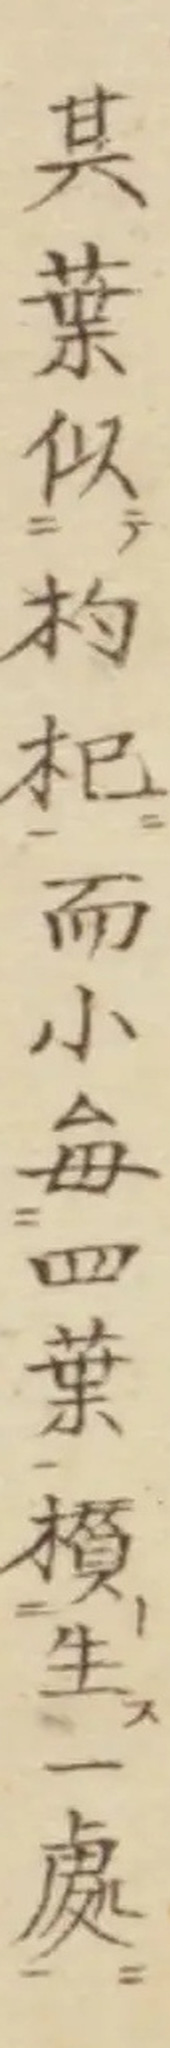其葉似テ枸杞ニ而小毎四葉櫕生ス櫕生ス一處ニ
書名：梅園草木花譜春之部. 3
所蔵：国立国会図書館 National Diet Library, JAPAN
